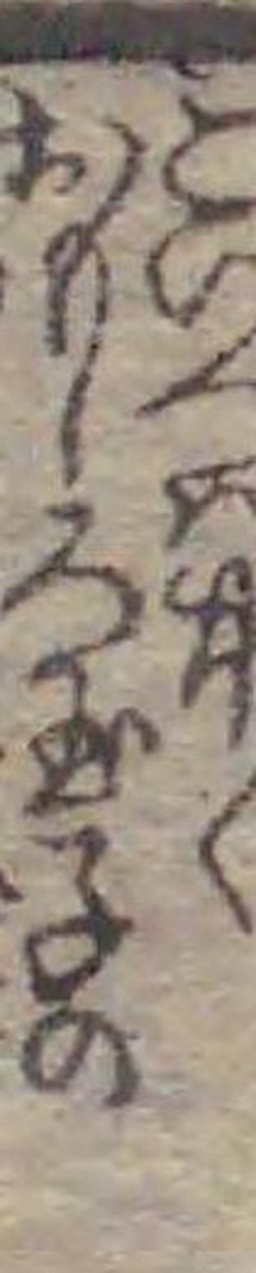おもしろ玉子の
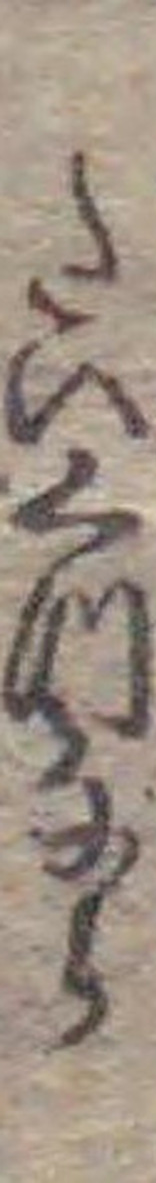たいくつなら
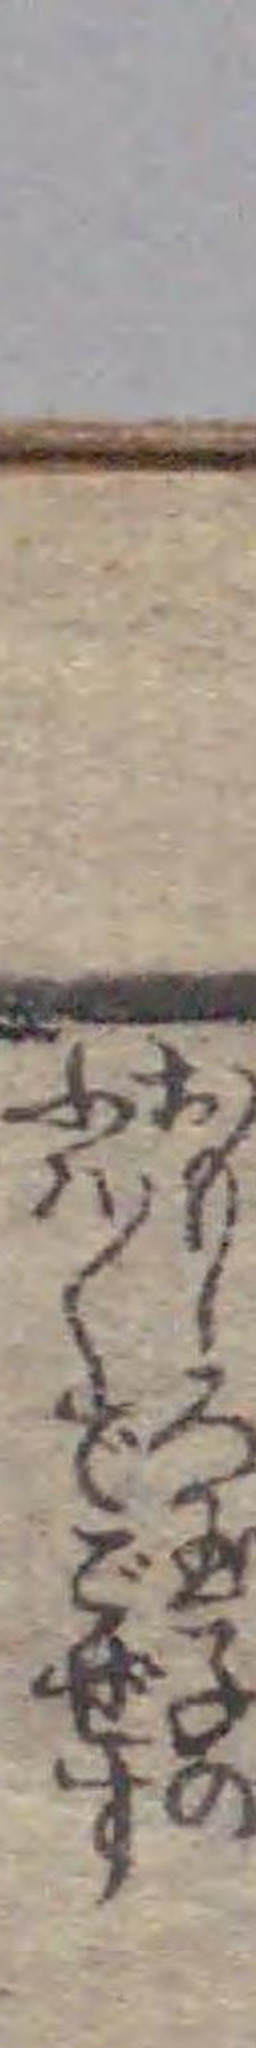ふは〳〵でごぜす
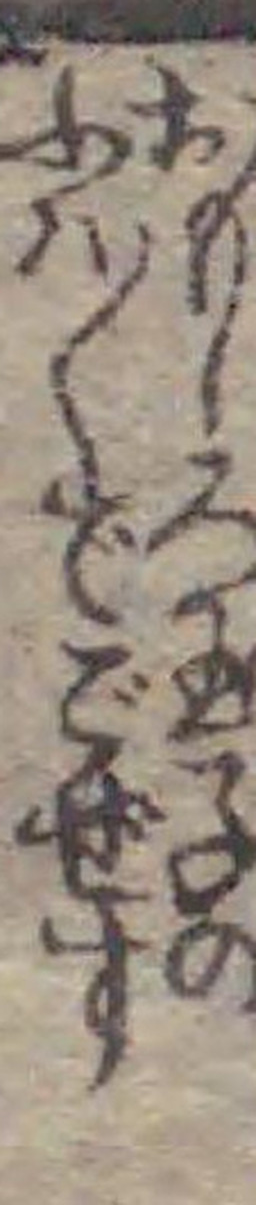ふは〳〵でごぜす
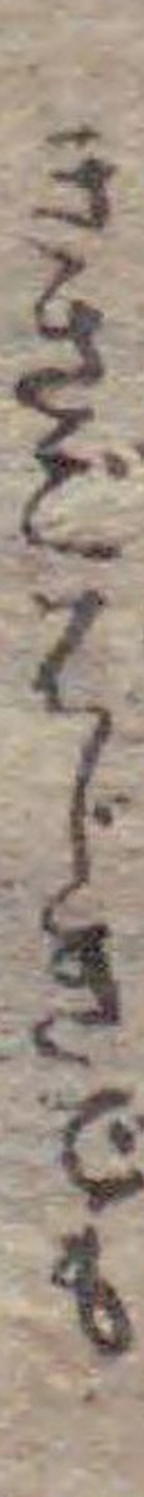きさごはじきでも
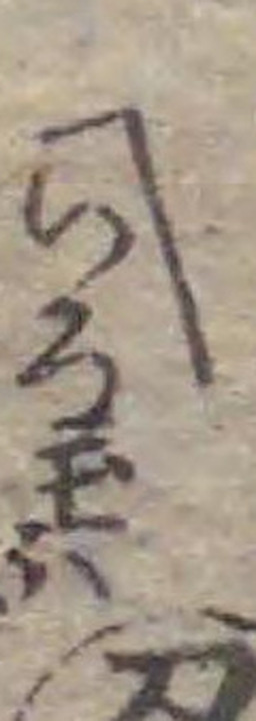〽いろ玉は
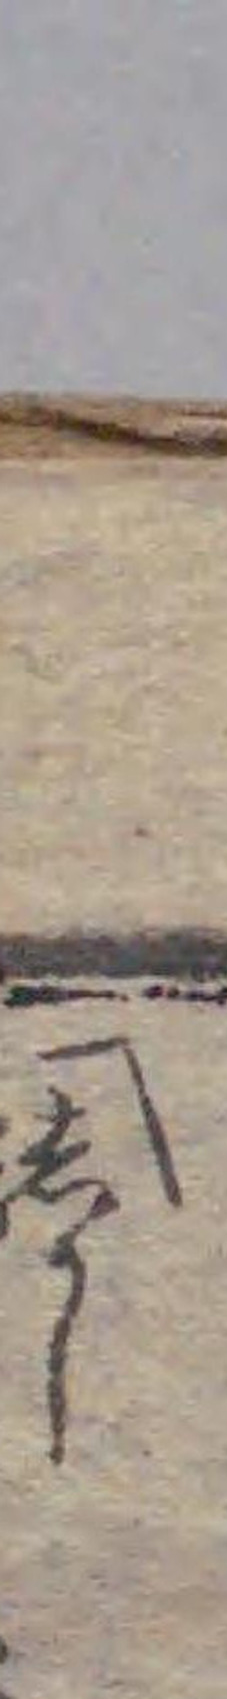〽しかし
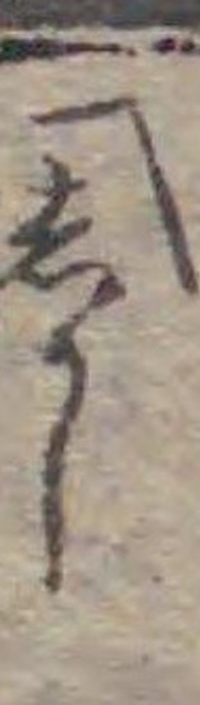〽しかし
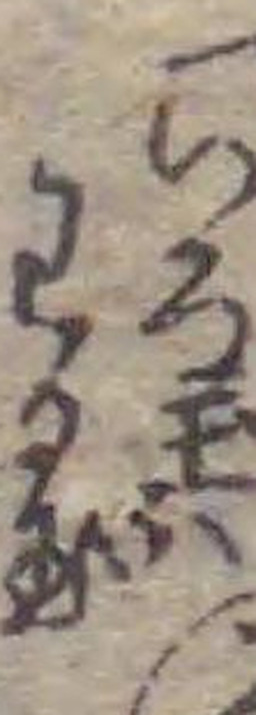わる玉
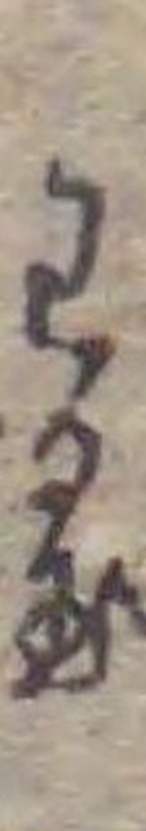わる玉
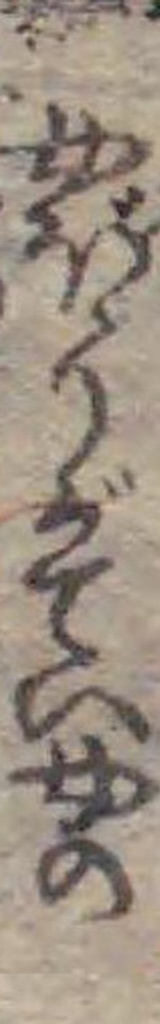女ぼうがてい女の
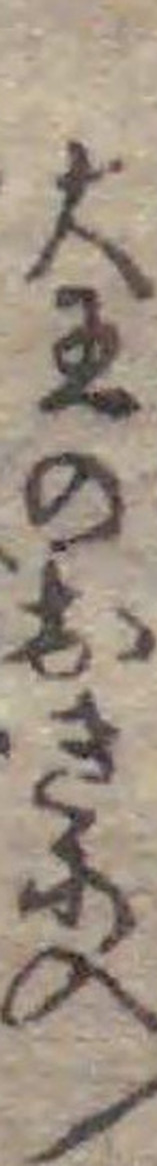大王のおきに入
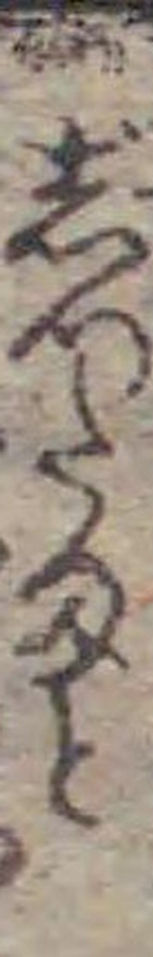じつたまと
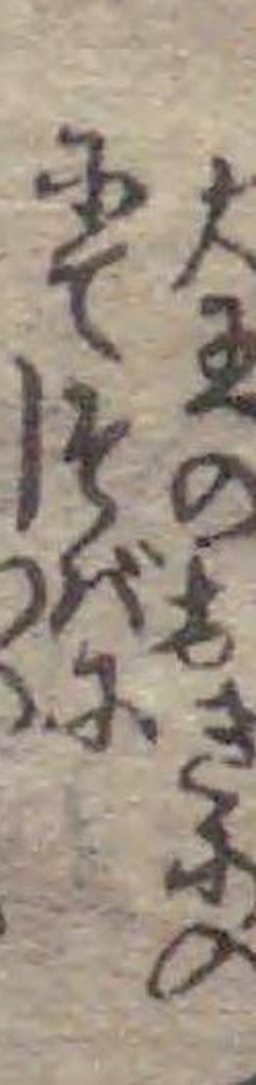にてそばに
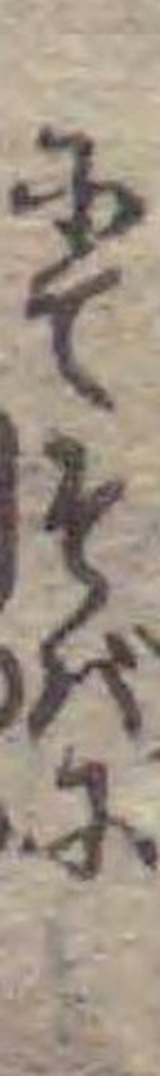にてそばに
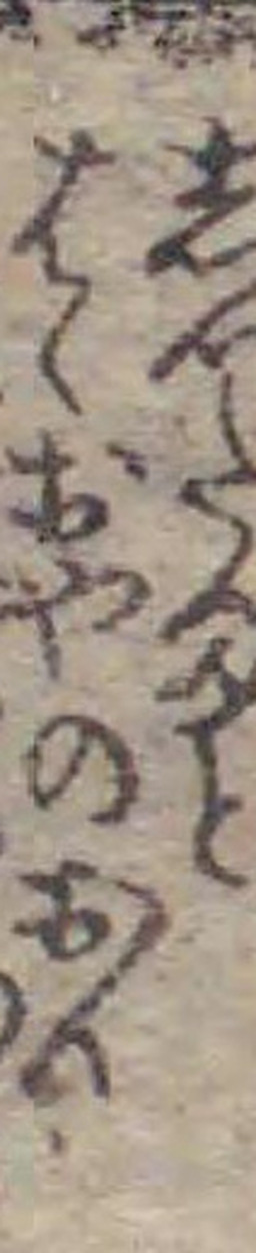はゝおやのおん
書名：四遍搨心学草帋 : 3巻
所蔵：国立国会図書館 National Diet Library, JAPAN
